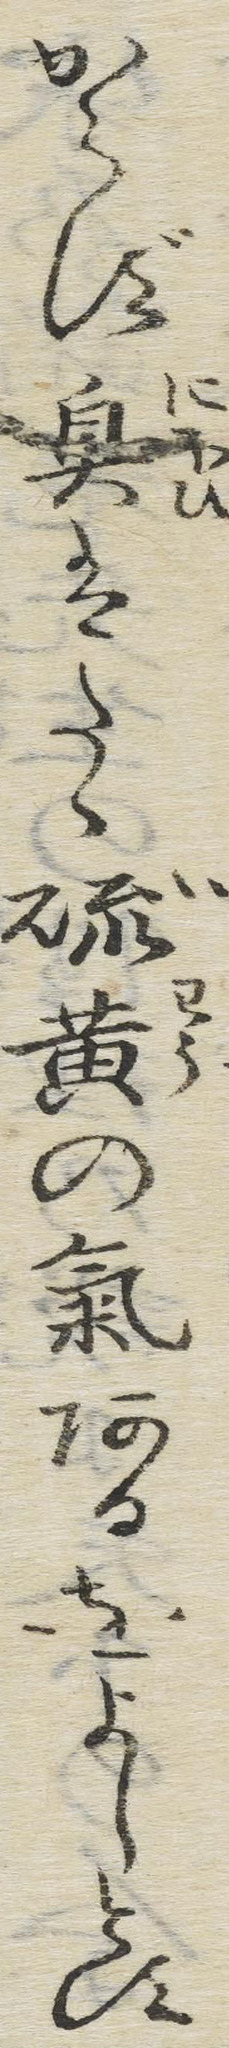からず臭はたゝ硫黄の気あるをよしとす
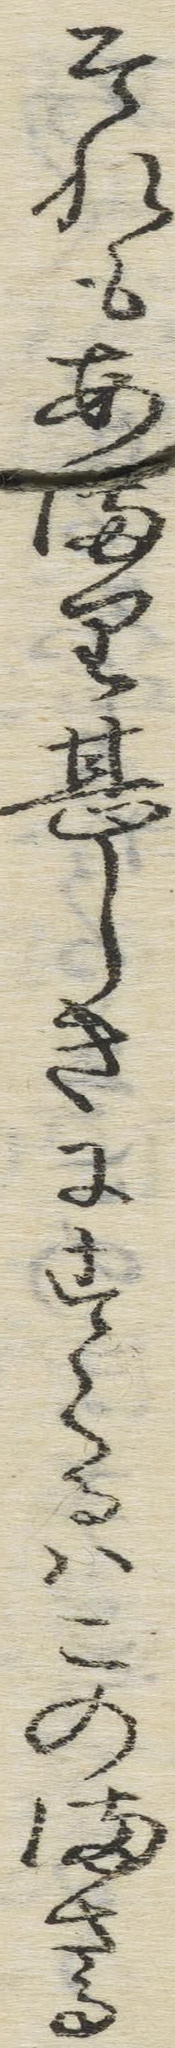それもあまり甚しきにすくるはこのまさる
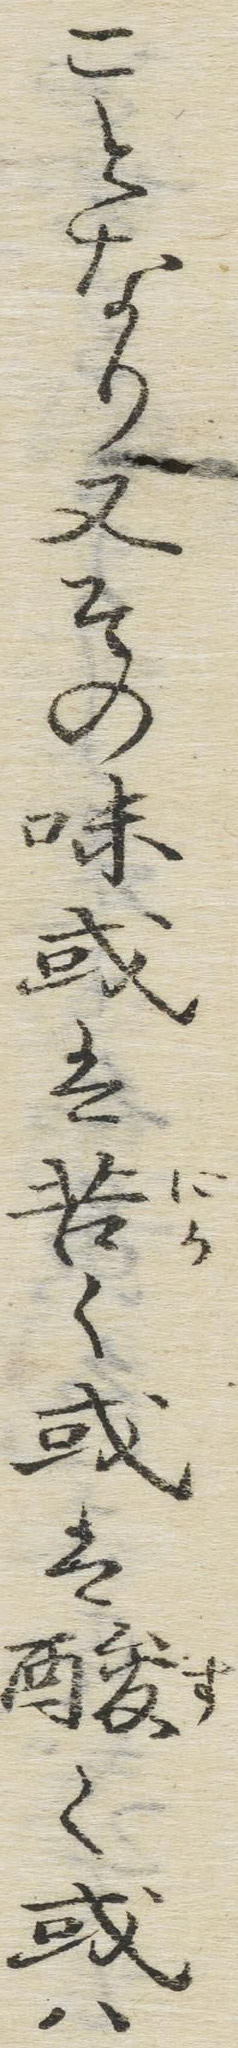ことなり又その味或は苦く或は酸く或は
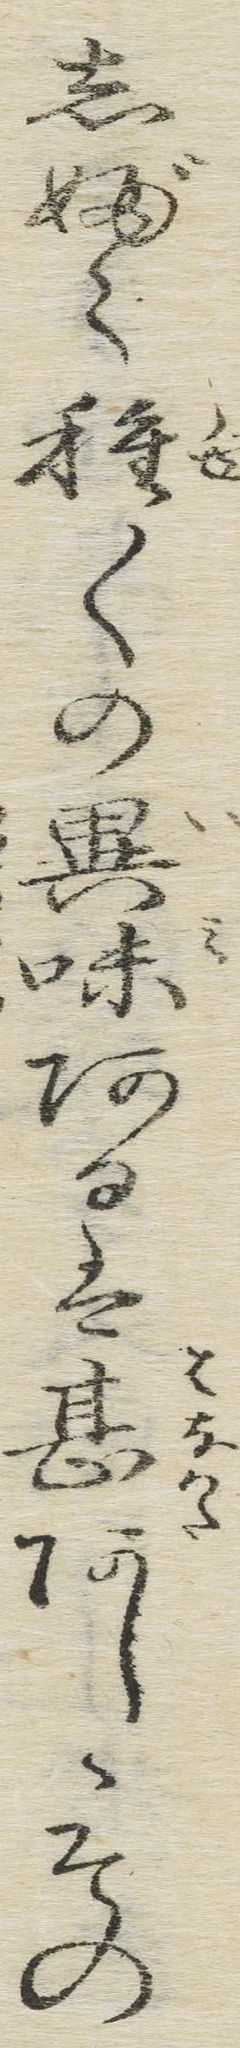しぶく種〳〵の異味あるは甚あしくその
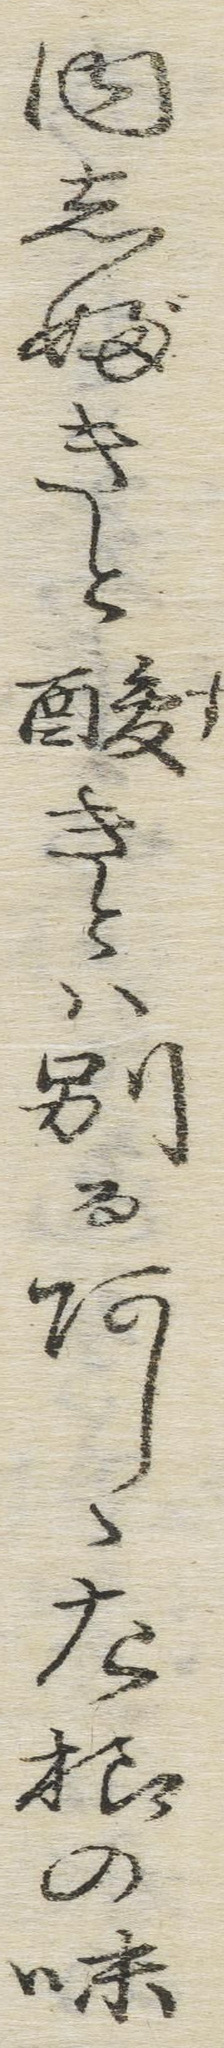内しぶきと酸きとは別るあしく左様の味
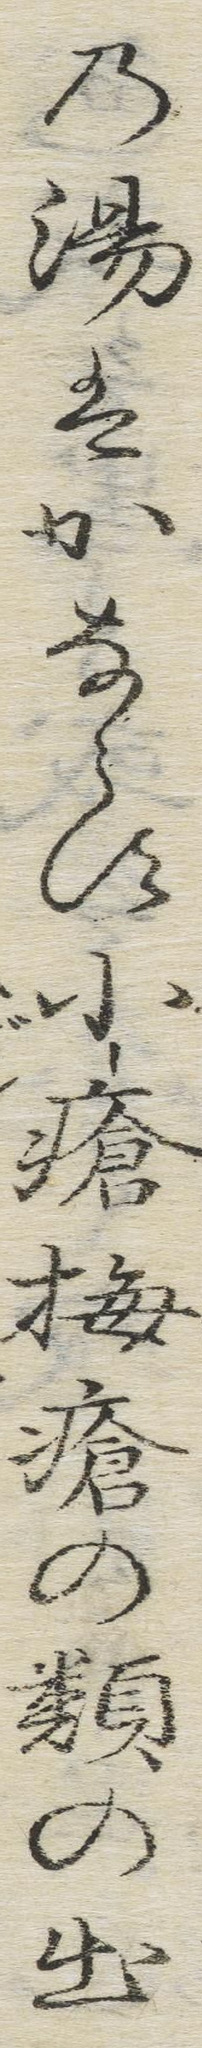の湯はかならす小瘡梅瘡の類の出
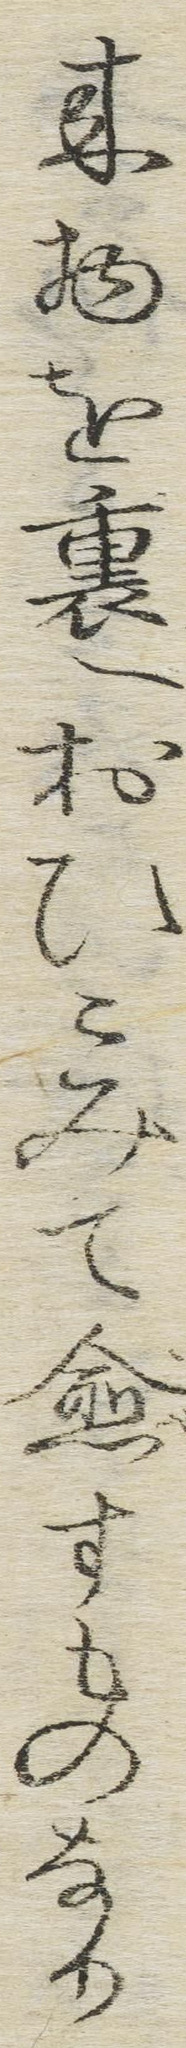来物を裏へおひこみて癒すものなり
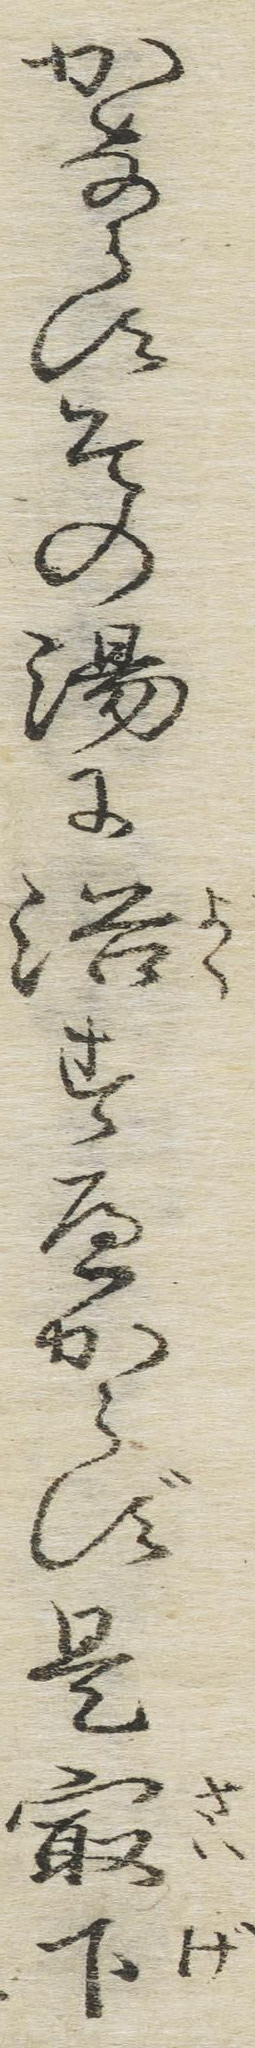かならすその湯に浴すへからず是最下
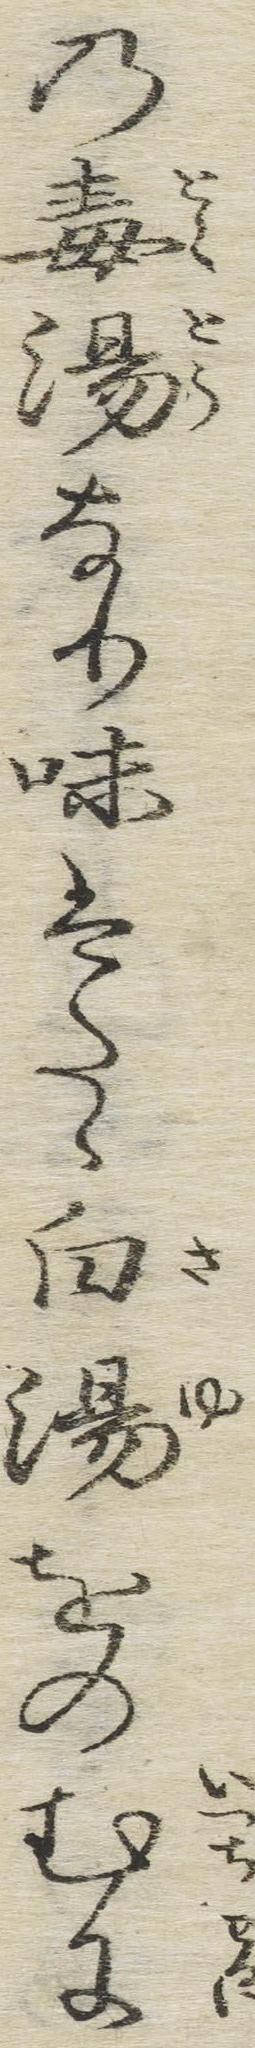の毒湯なり味はたゝ白湯をのむに

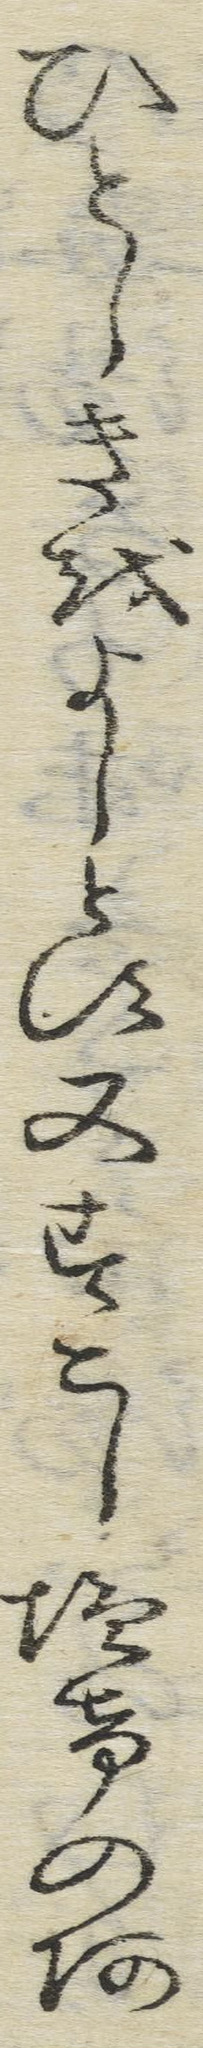ひとしきをよしとす又すこし塩けのあ
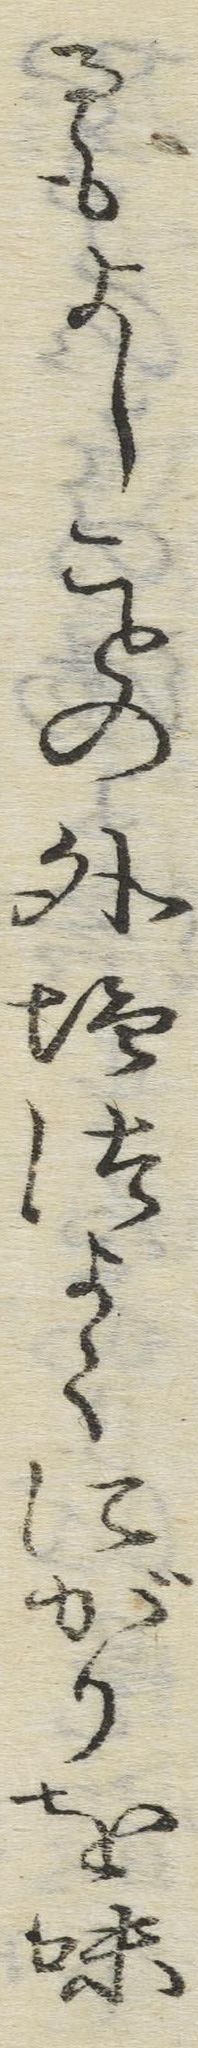るもよしことの外塩つよくにがりを味
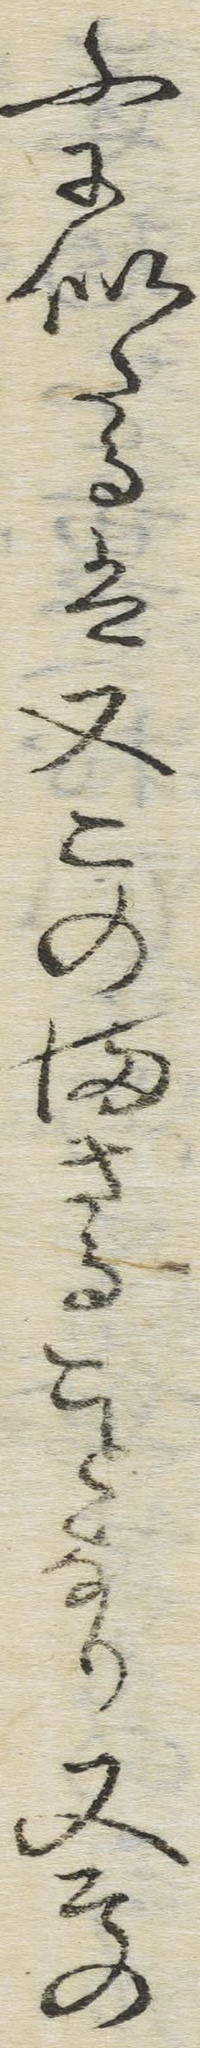ふる似たるは又このまさることなり又その
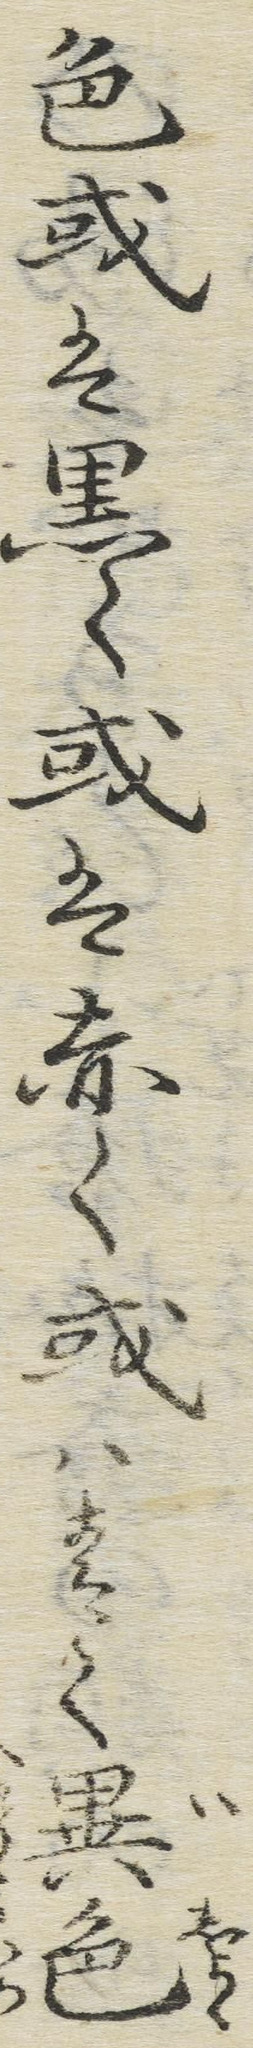色或は黒く或は赤く或は青く異色
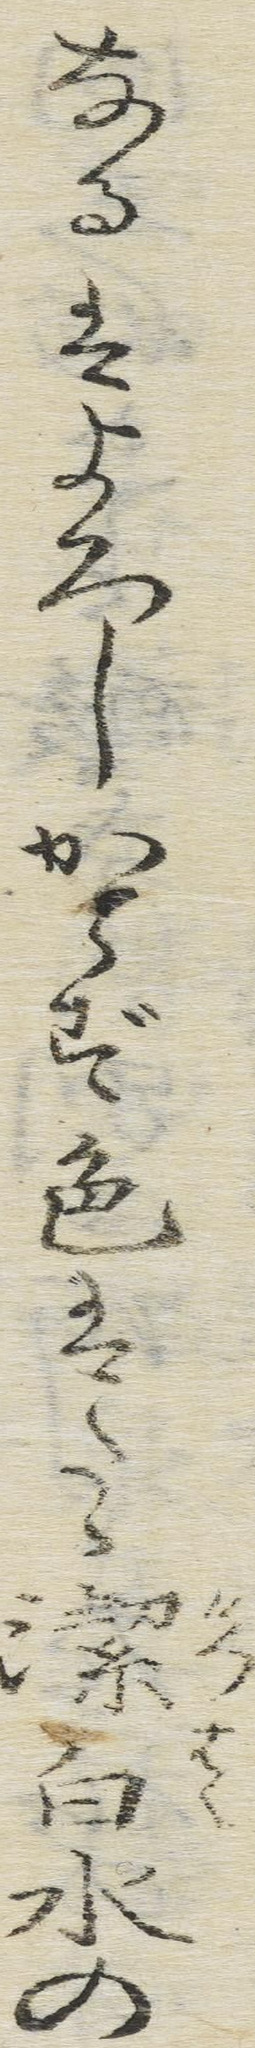なるはよろしからず色はたゝ潔白水の
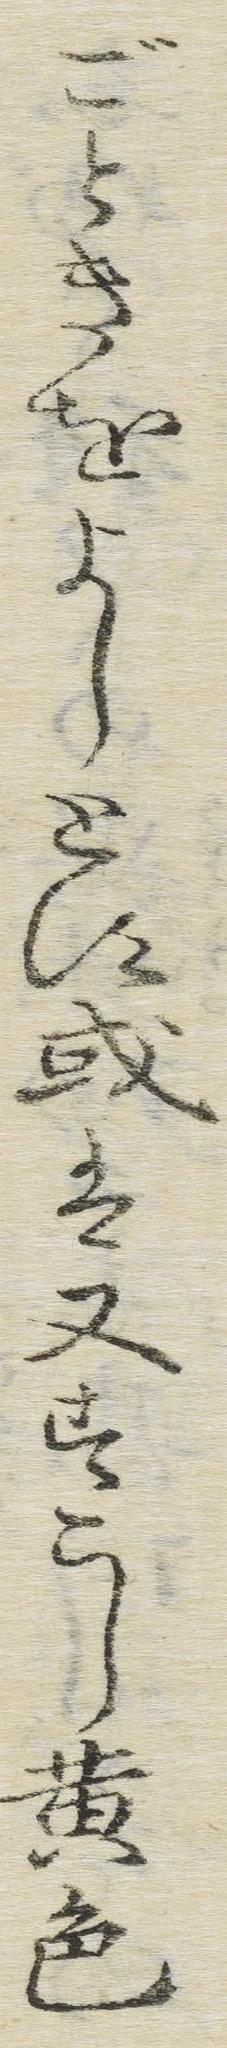ごときをよしとす或は又すこし黄色
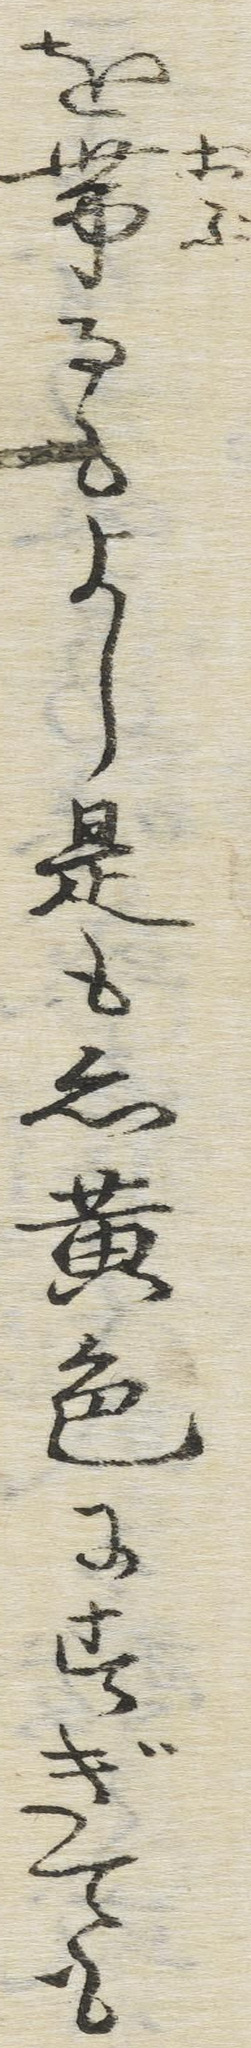を帯るもよし是も亦黄色にすぎても
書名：温泉考
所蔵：東京大学地震研究所図書室 Earthquake Research Institute Library, The University of Tokyo, JAPAN
